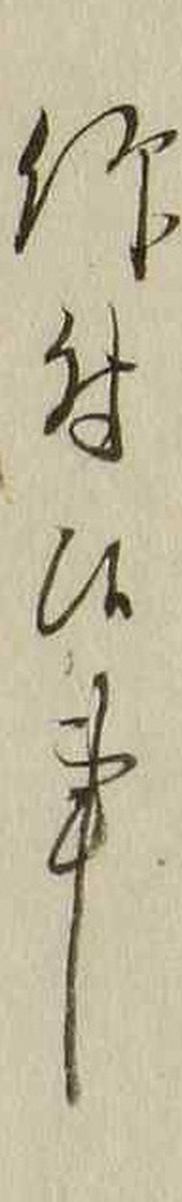仰出候事
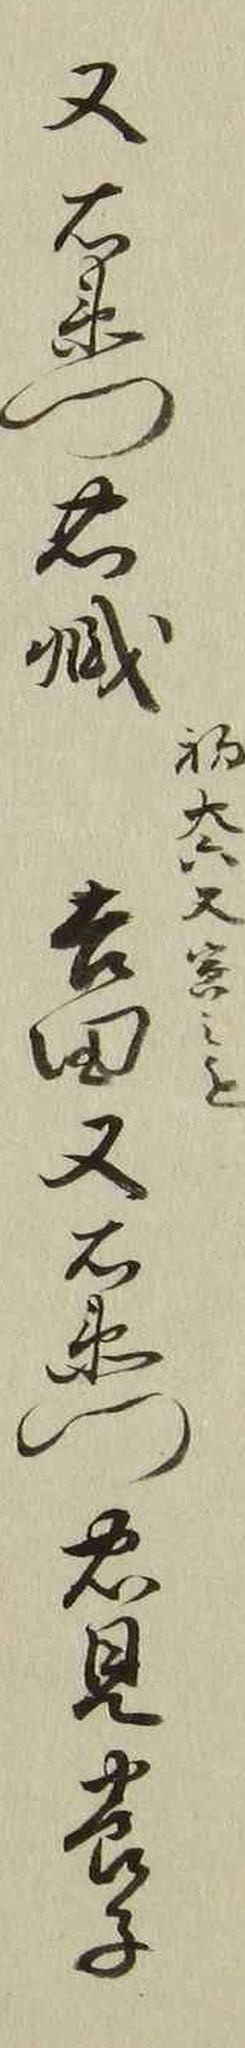又右衛門忠吉田又右衛門忠見養子
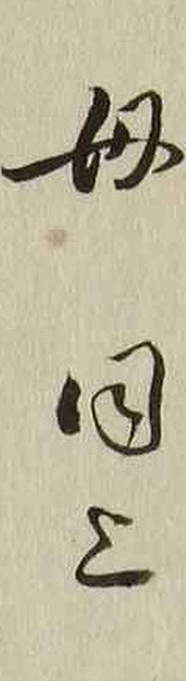母同上
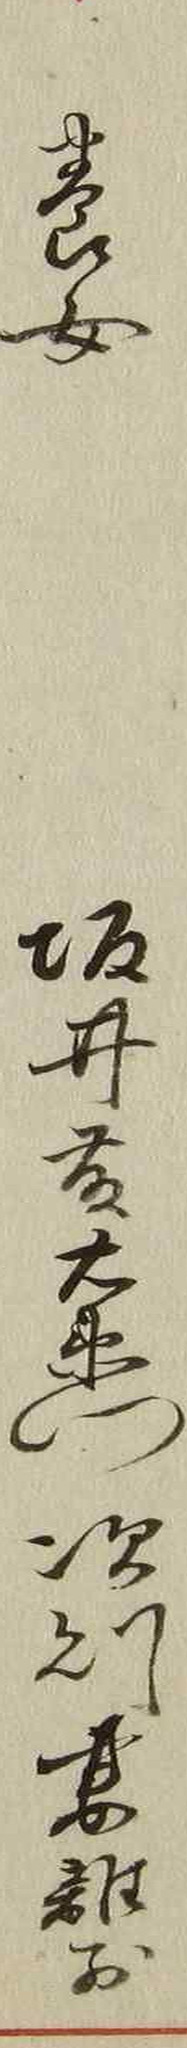養女坂井藤右衛門次則妻離別
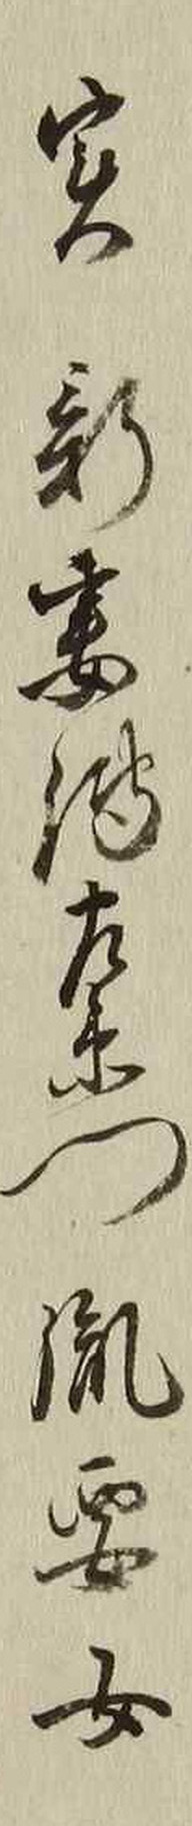実新妻伝左衛門胤要女
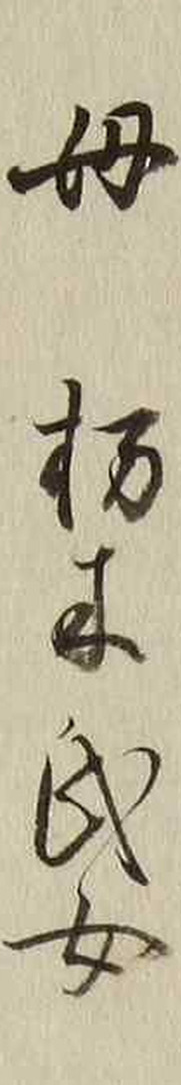母杤木氏女
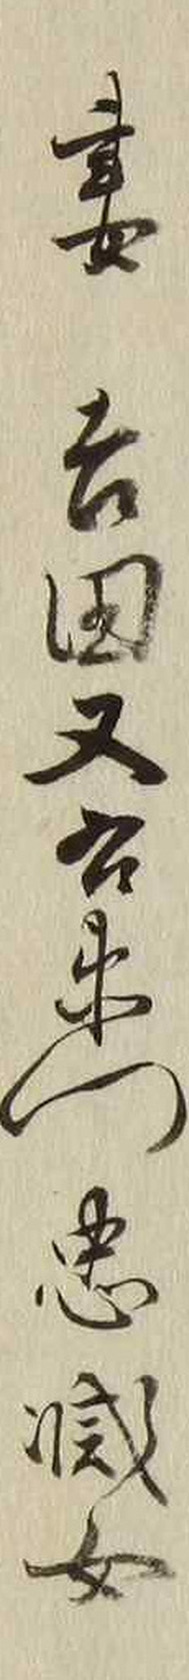妻吉田又右衛門忠滅女
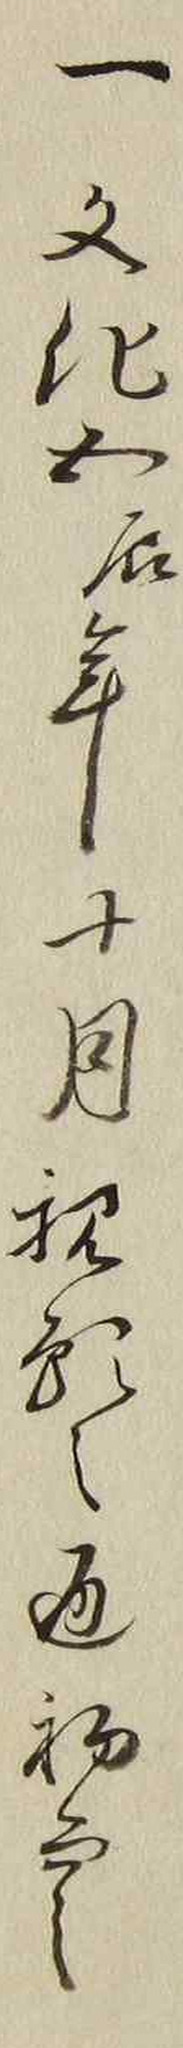一文化五辰年十月親願之通初而之
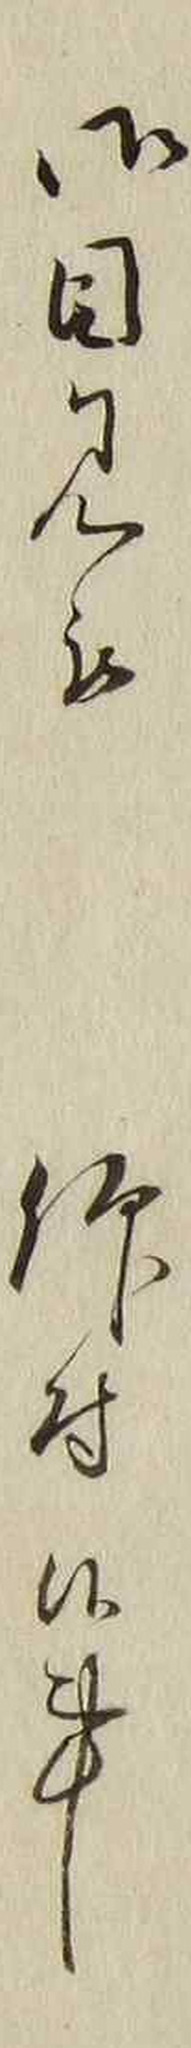御目見被仰付候事
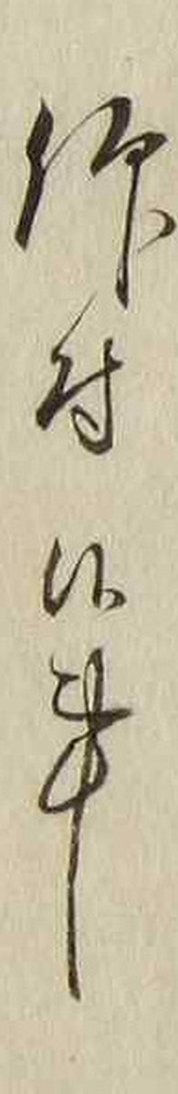仰出候事
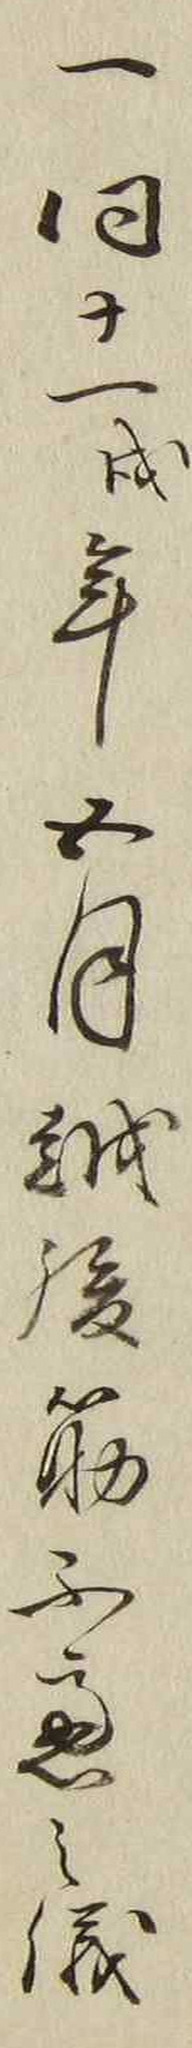一同十一戌年五月越後筋不慮之儀

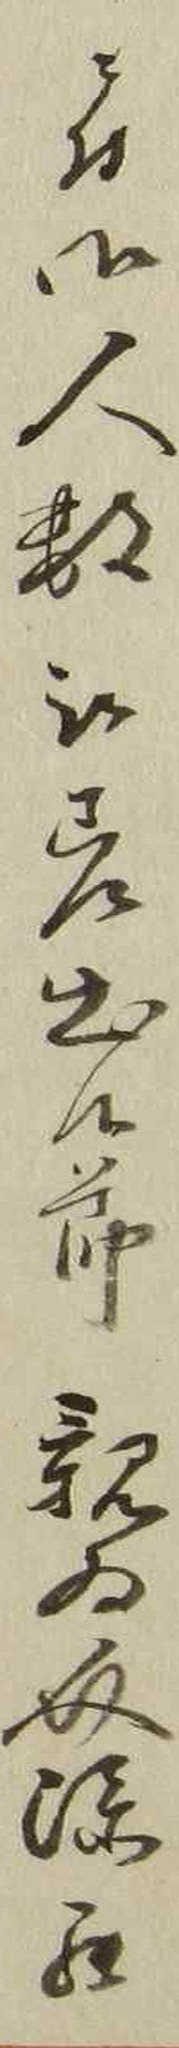ニ付御人数被差出候節親為介添罷
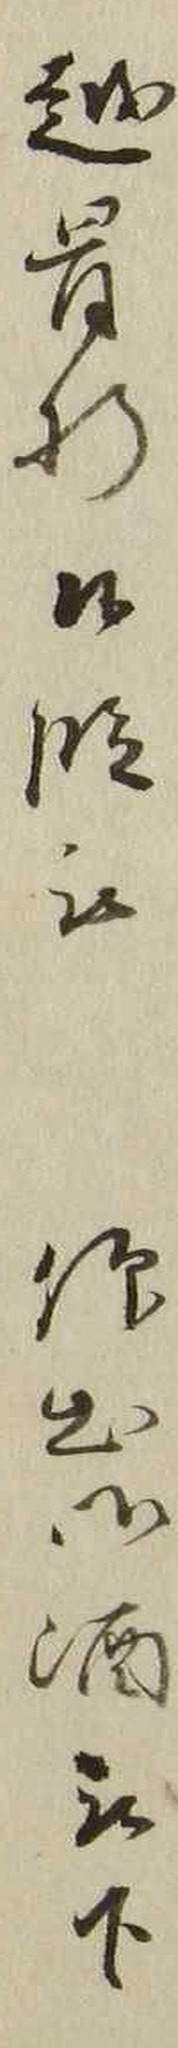越骨折候段被仰出御酒被下
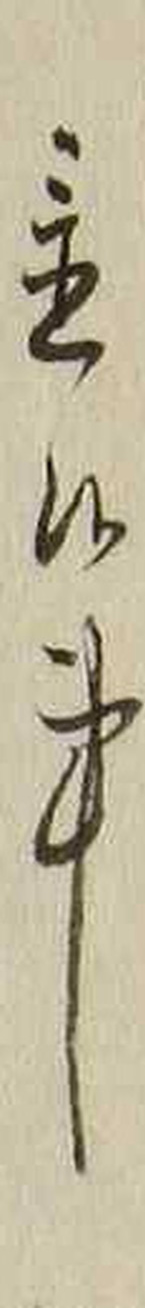置候事
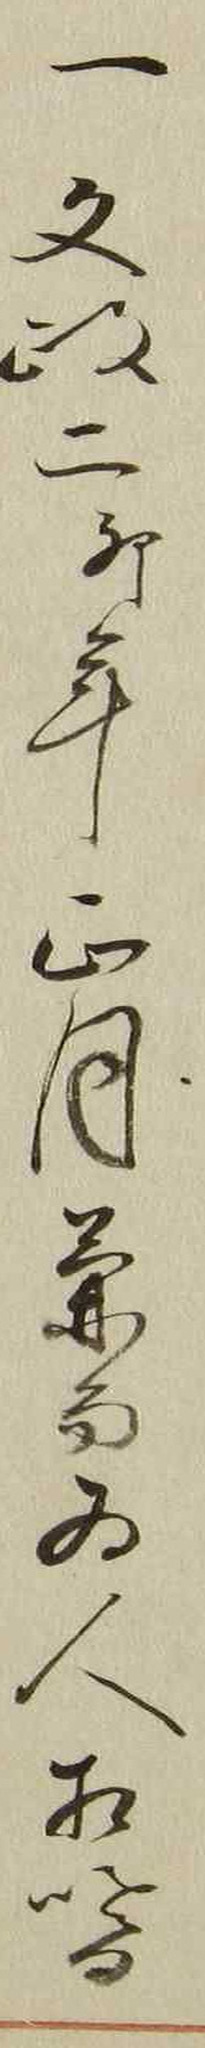一文政二卯年正月兼而為人相嗜
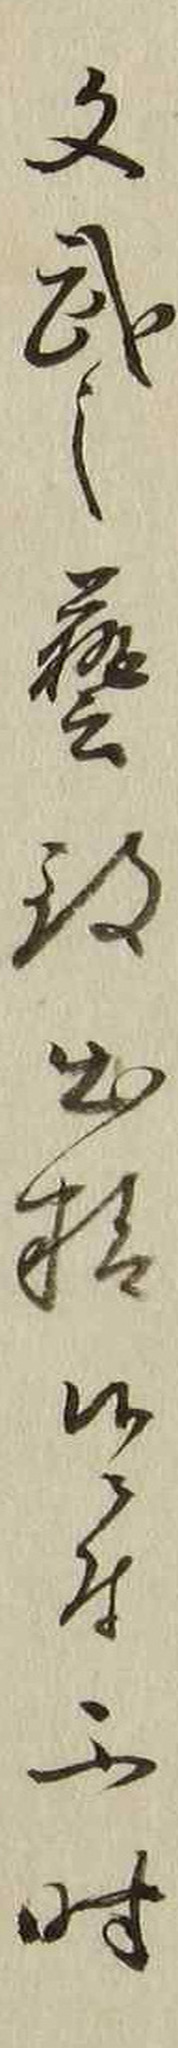文武之芸致出精候ニ付不時
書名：諸士系譜　巻之52　に之部3
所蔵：会津若松市立会津図書館
